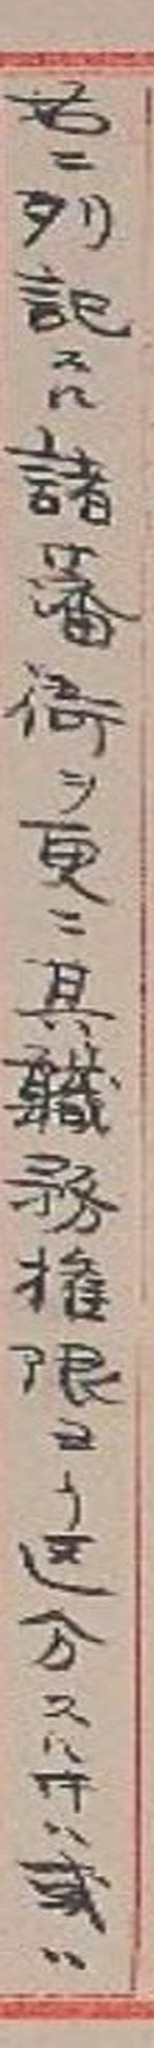右ニ列記スル諸藩衙ヲ更ニ其職務権限ヨリ区分スルトキハ或ハ
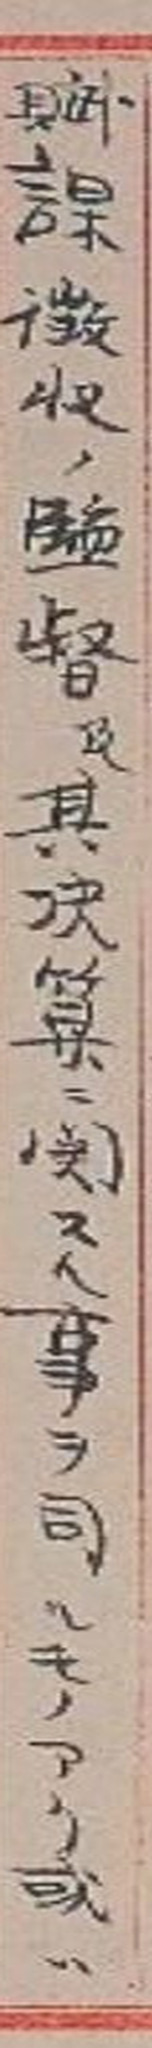賦課徴収ノ監督及其決算ニ関スル事ヲ司ルモノアリ或ハ
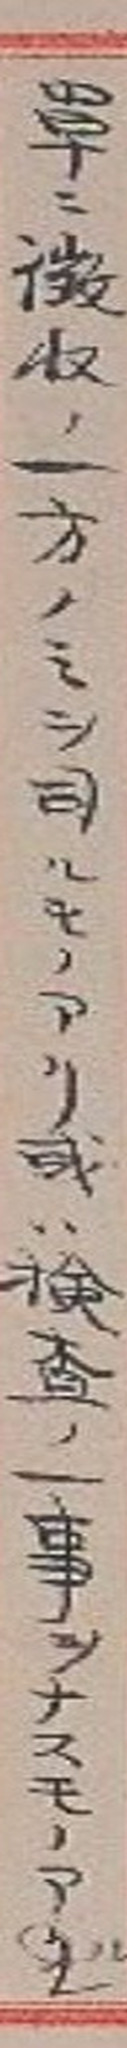単ニ徴収ノ一方ノミヲ司ルモノアリ或ハ検査ノ一事ヲナスモノアル
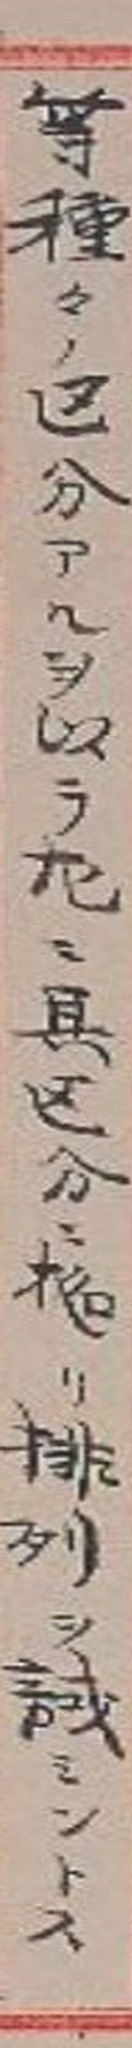等種々ノ区分アルヲ以テ左ニ其区分ニ拠リ排列ヲ試ミントス
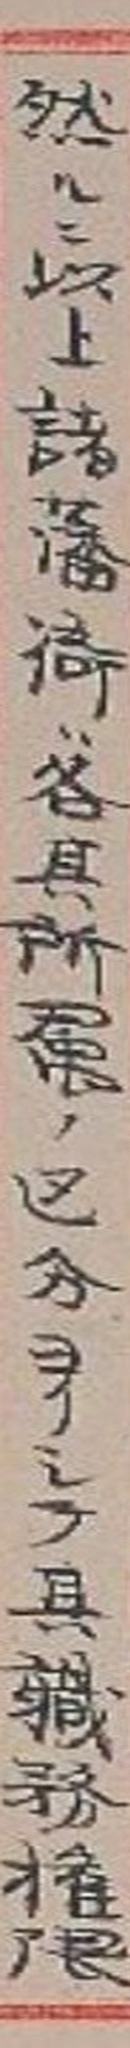然ルニ以上諸藩衙ハ各其所属ノ区分ヨリシテ其職務権限
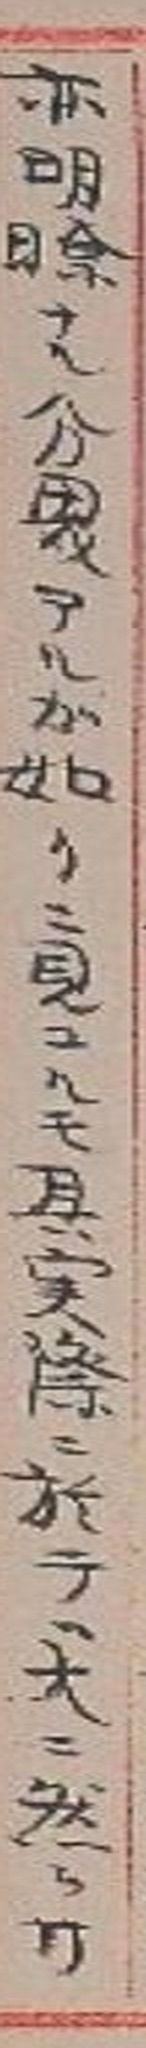亦明瞭ナル分界アルガ如クニ見ユルモ其実際ニ於テハ大ニ然ラサ

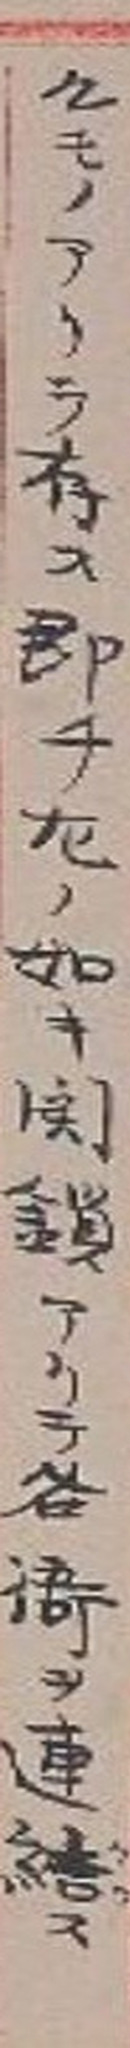ルモノアリテ存ス即チ左ノ如キ関鎖アリテ各衙ヲ連結ス
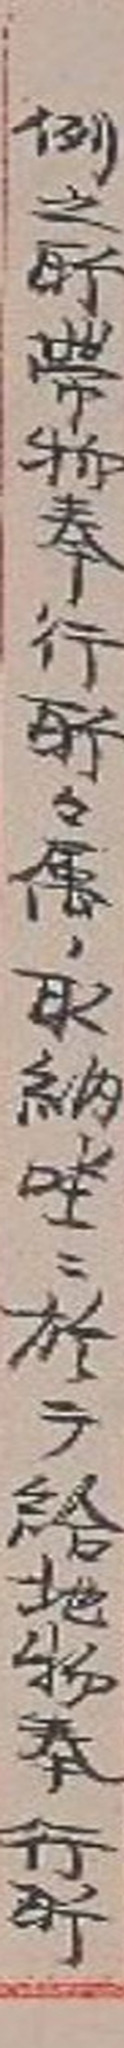例之所帯物奉行所々属ノ取納坐ニ於テ給地物奉行所
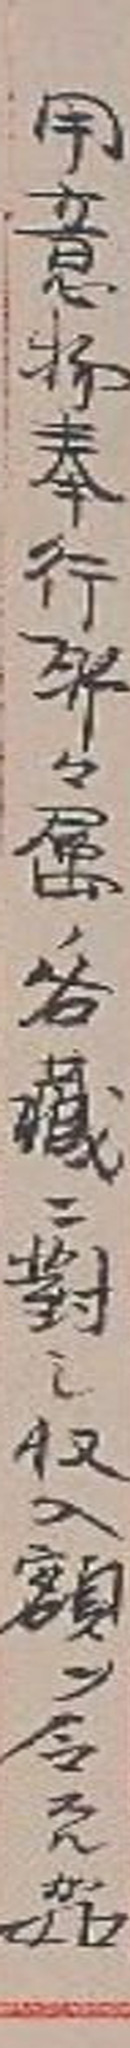用意物奉行所々属ノ各蔵ニ対シ収入額ヲ令スルガ如
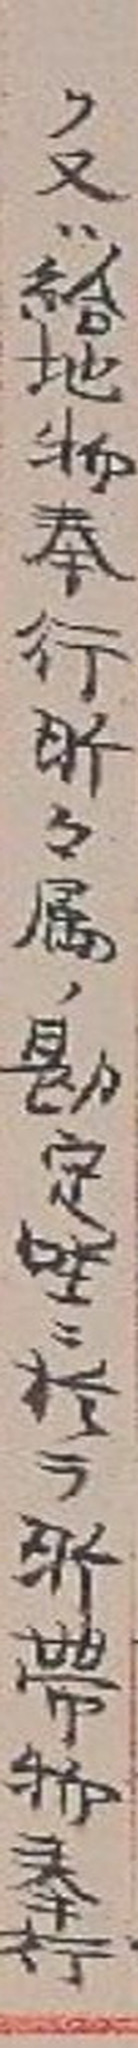ク又ハ給地物奉行所々属ノ勘定坐ニ於テ所帯物奉行
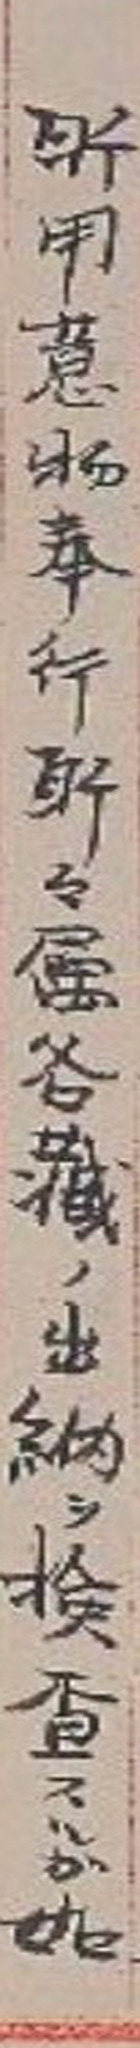所用意物奉行所々属各蔵ノ出納ヲ検査スルガ如
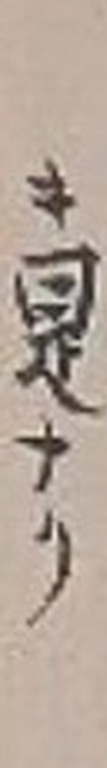キ是ナリ
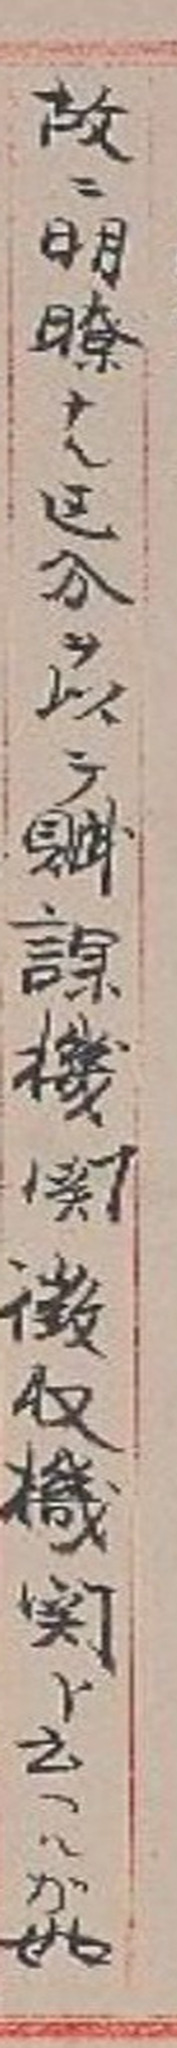故ニ明瞭ナル区分ヲ以テ賦課機関徴収機関ト云ヘルガ如
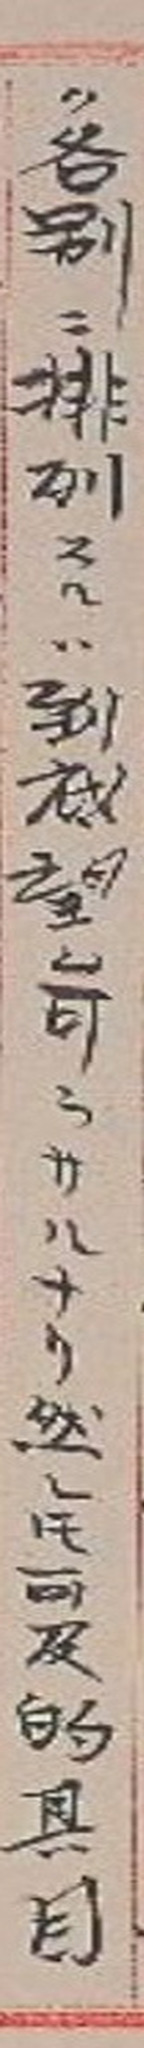ク各別ニ排列スルハ到底望ム可ラサルナリ然レトモ可及的其目
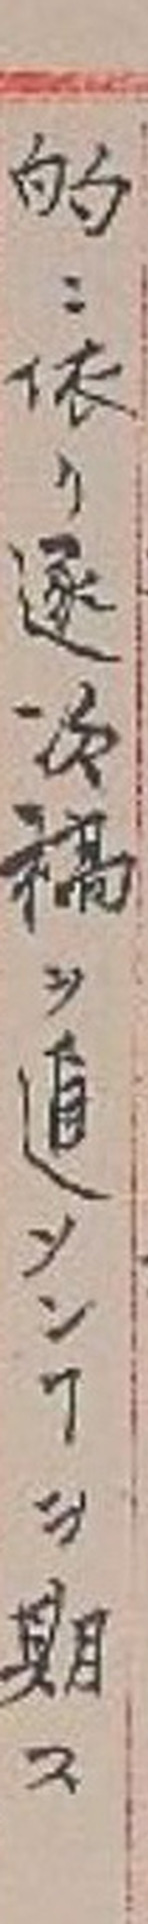的ニ依リ逐次稿ヲ進メンヿヲ期ス
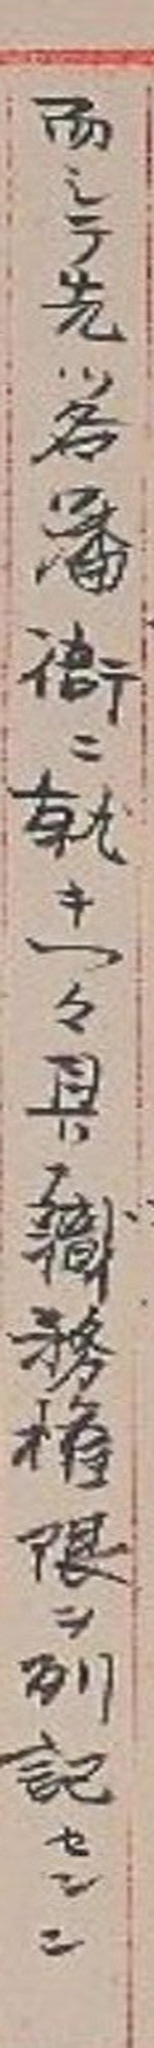而シテ先ツ各藩衙ニ就キ一々其職務権限ヲ列記センニ
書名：旧藩中租税徴収ニ関スル事項
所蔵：University of the Ryukyus Library
